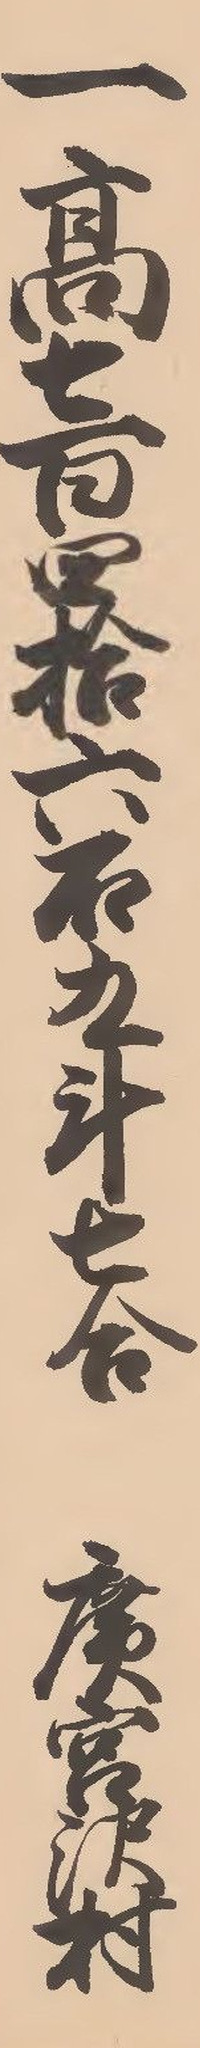一高七百四拾六石九斗七合広宮沢村
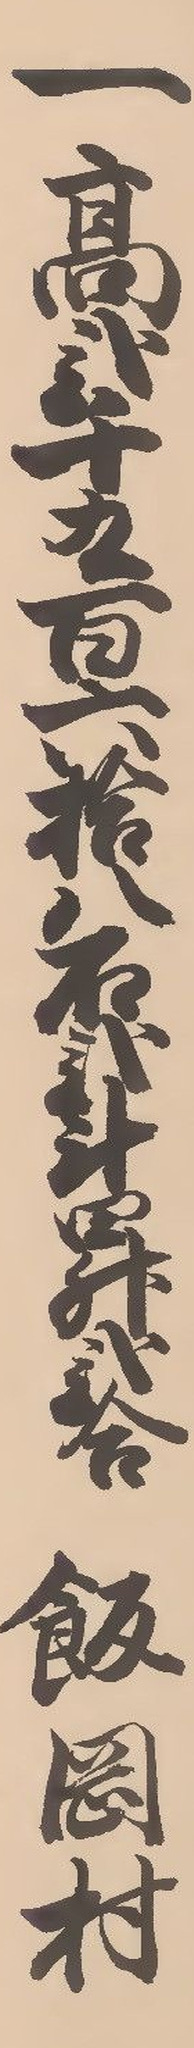一高弐千九百六拾八石弐斗四升弐合飯岡村
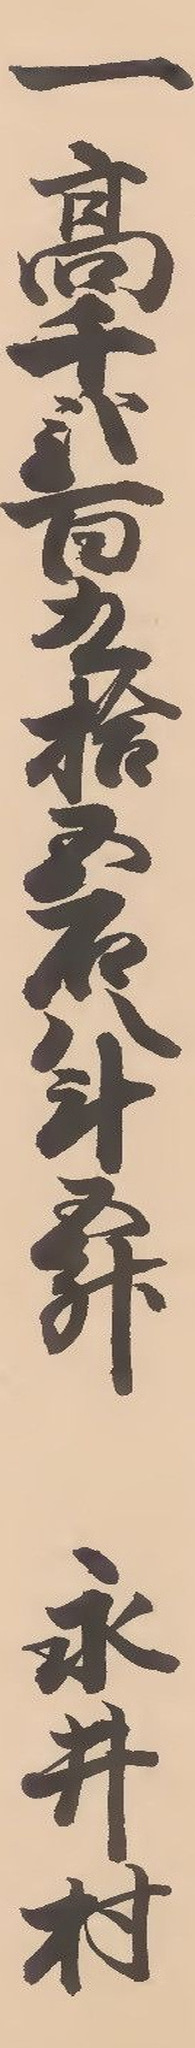一高千弐百九拾五石八斗五升永井村
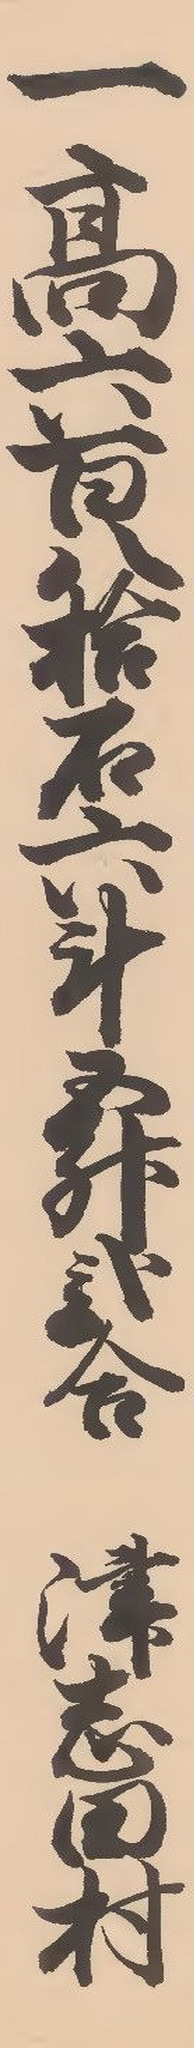一高六百八拾石六斗五升弐合津志田村
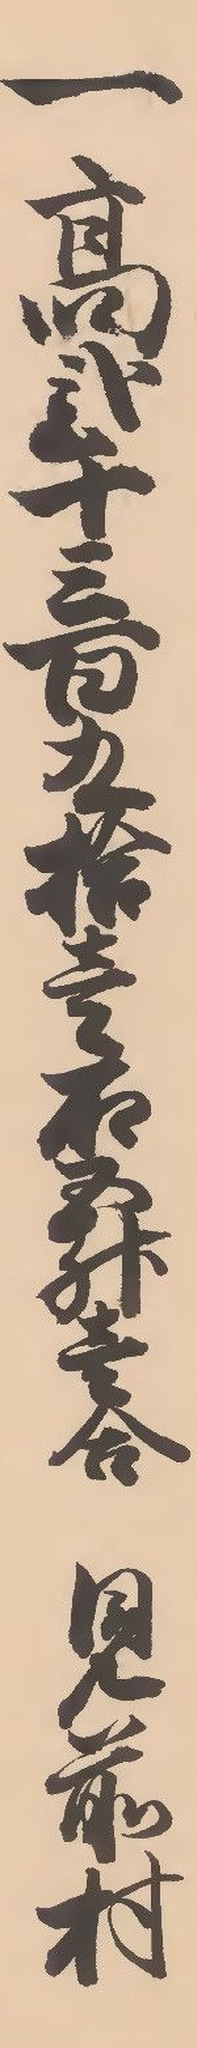一高弐千三百九拾壱石五升壱合見前村

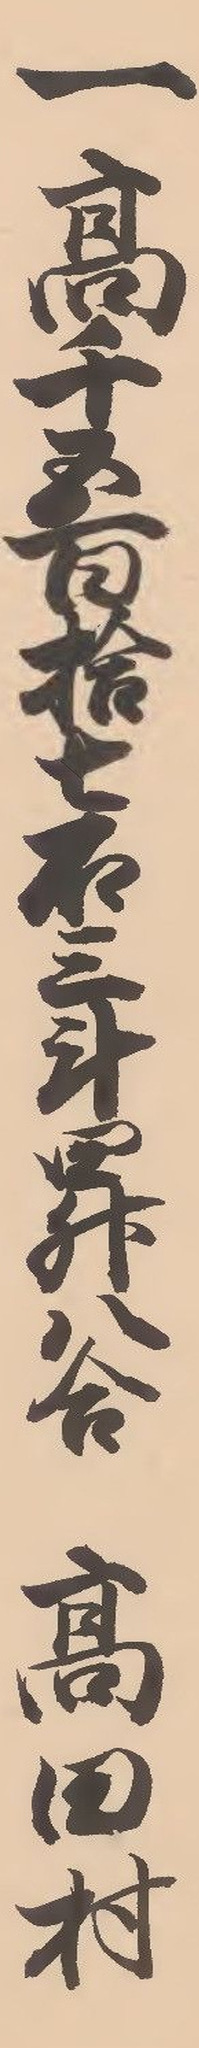一高千五百拾七石三斗四升八合高田村
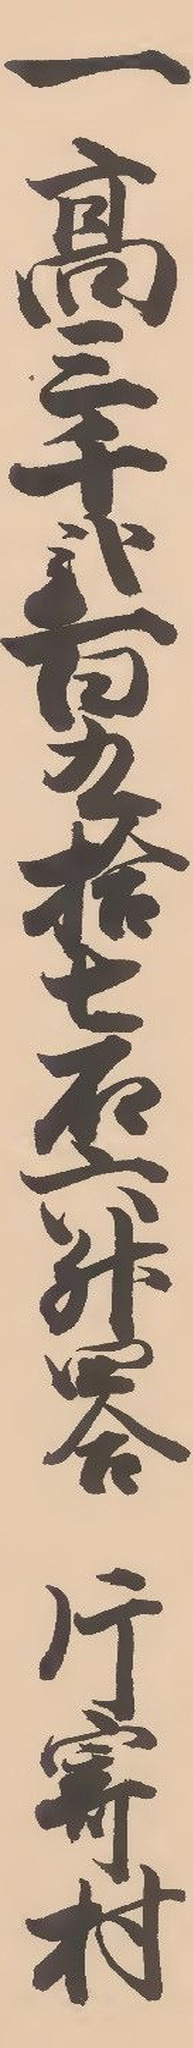一高三千弐百九拾七石六升四合片寄村
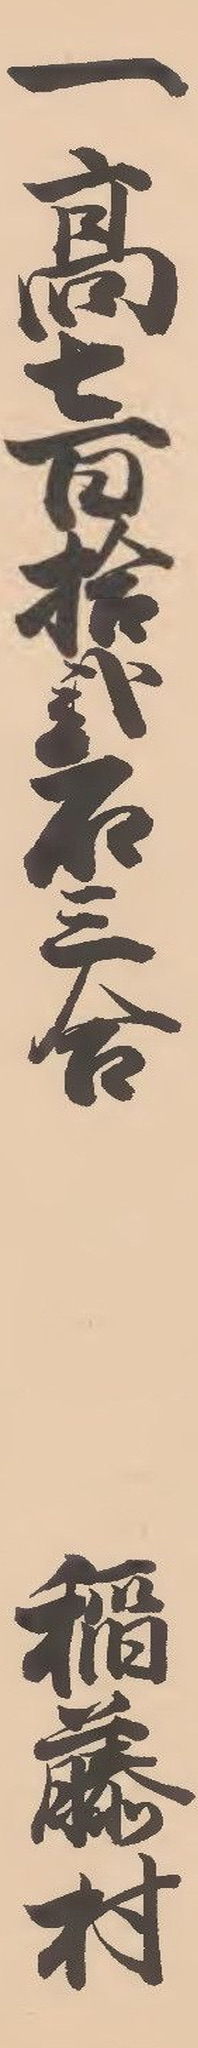一高七百拾弐石三合稲藤村
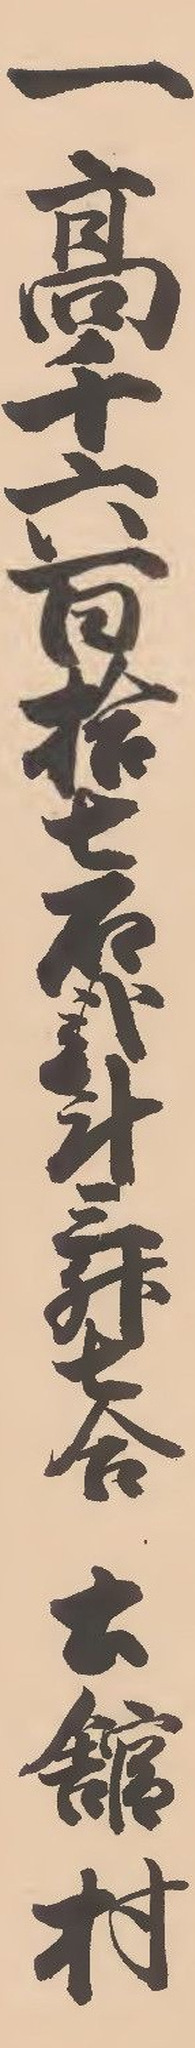一高千六百拾七石弐斗三升七合土舘村
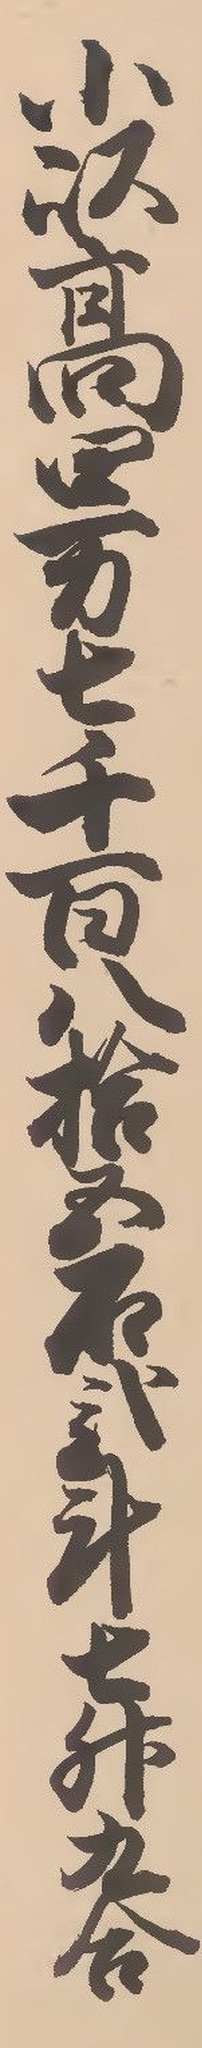小以高四万七千百八拾五石弐斗七升九合

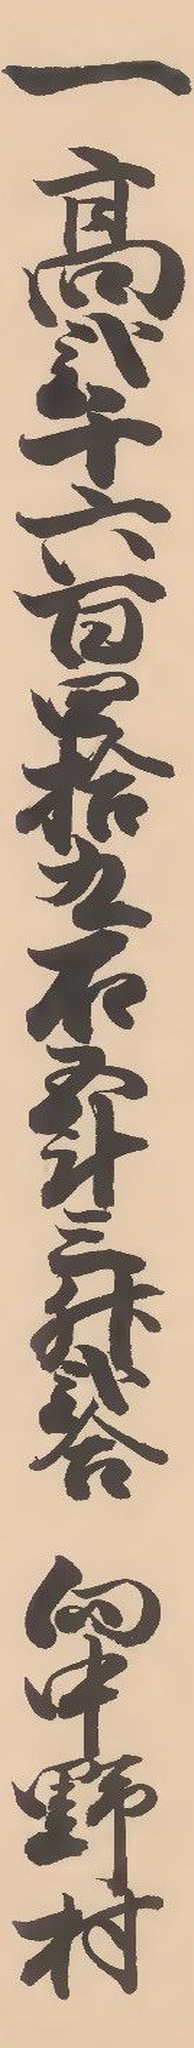一高弐千六百四拾九石五斗三升弐合向中野村
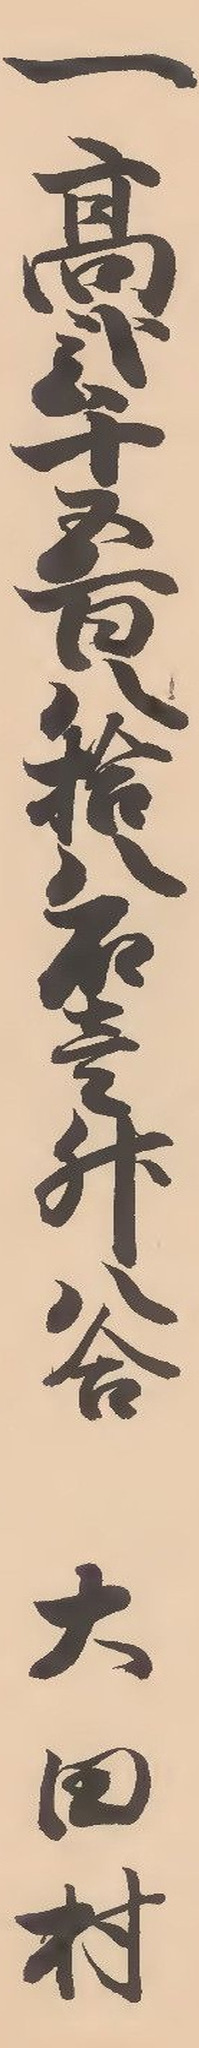一高弐千五百八拾八石壱升八合大田村
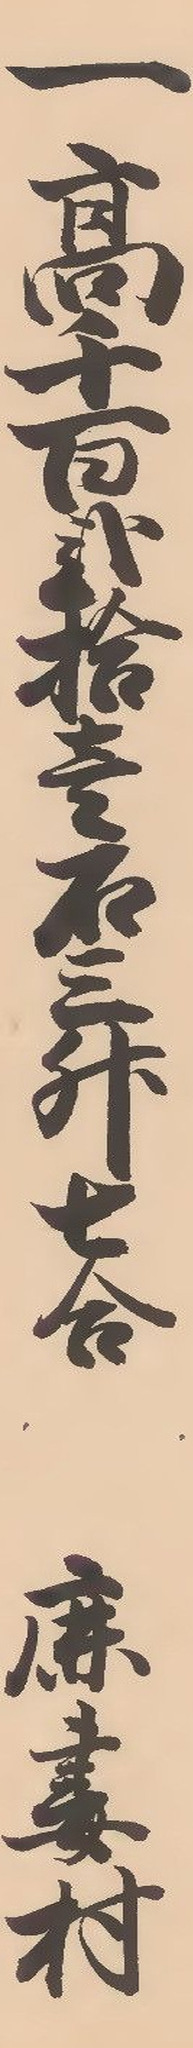一高千百弐拾壱石三升七合鹿妻村
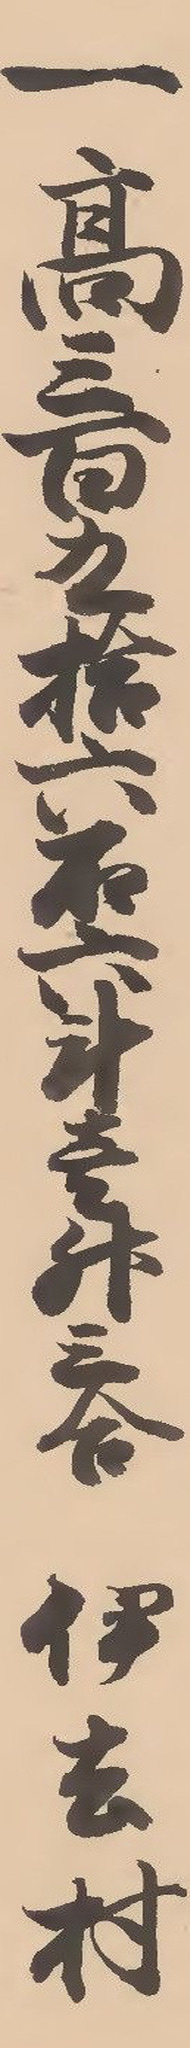一高三百九拾六石六斗壱升三合伊去村
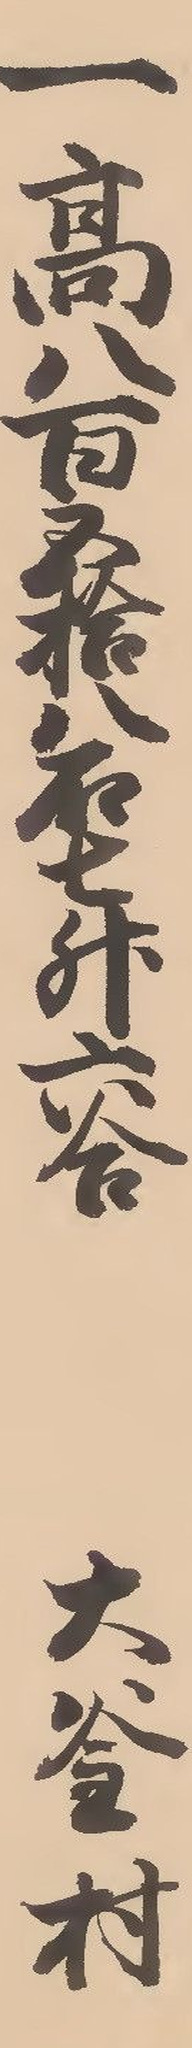一高八百五拾八石七升六谷大釜村
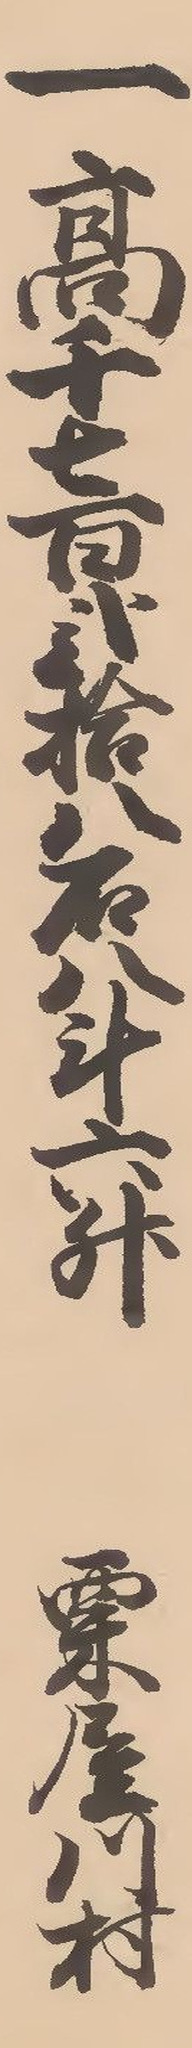一高千七百弐拾八石八斗六升栗屋川村
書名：陸奥国郷帳　６
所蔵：国立公文書館 National Archives of Japan
